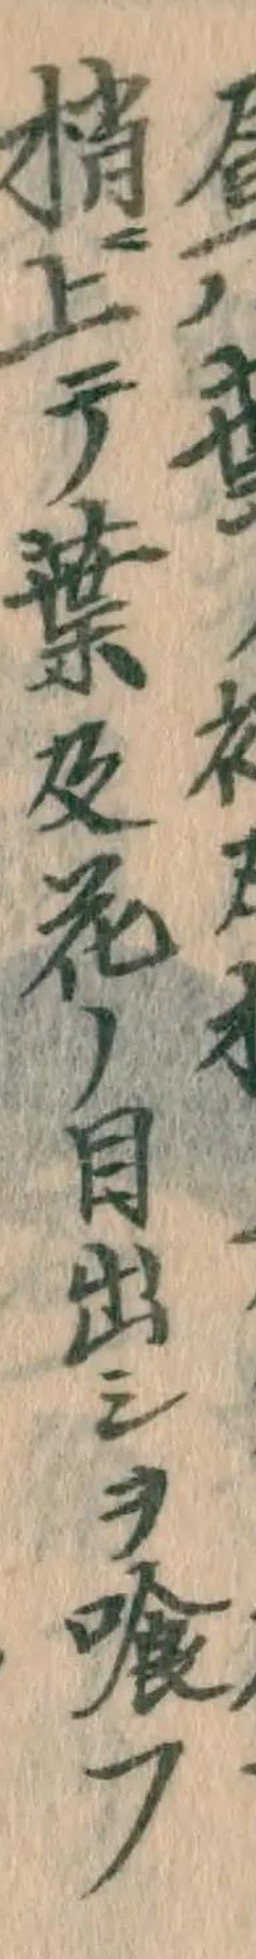梢ニ上テ葉及花ノ目出シヲ喰フ
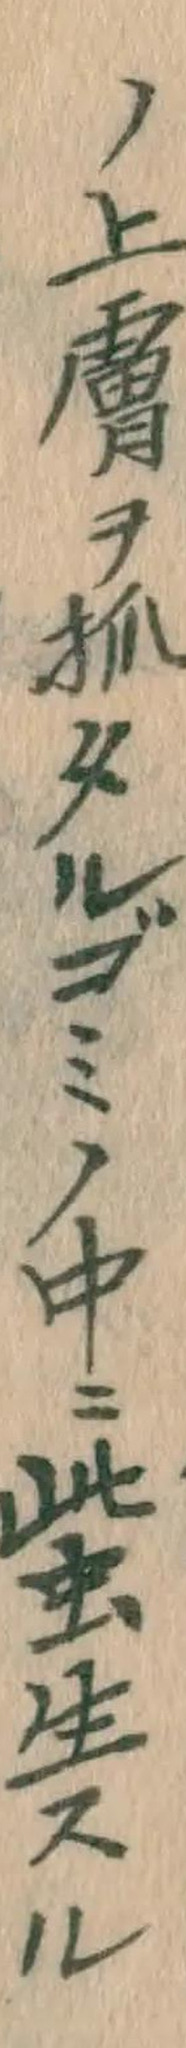ノ上膚ヲ抓タルゴミノ中ニ此虫生スル
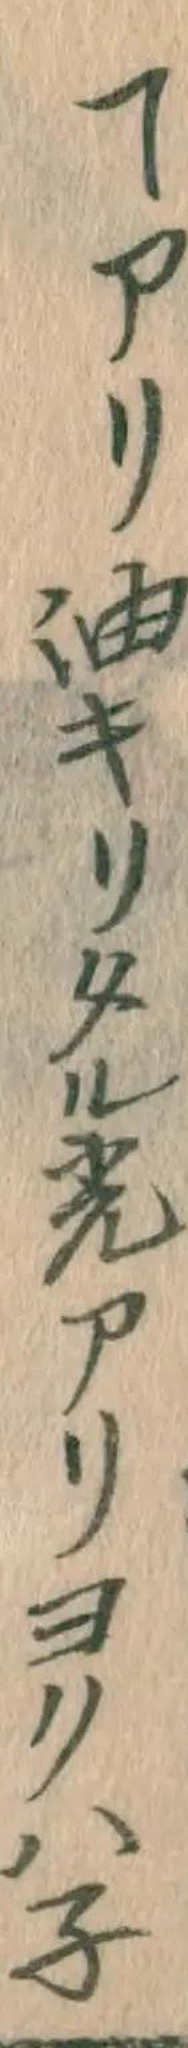コトアリ油キリタル光アリヨクハネ
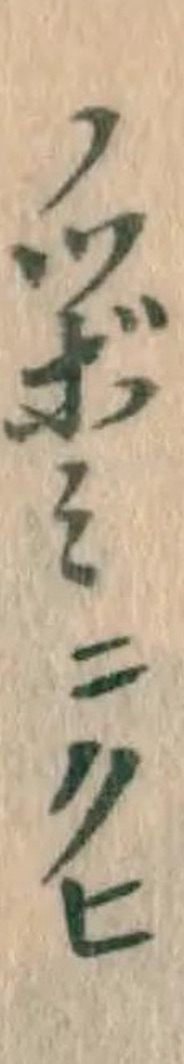ノツボミニクヒ入
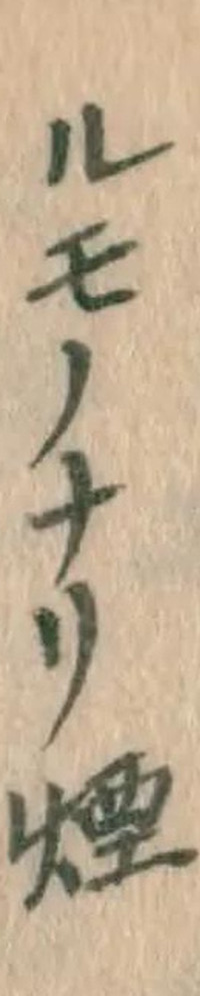ルモノナリ煙
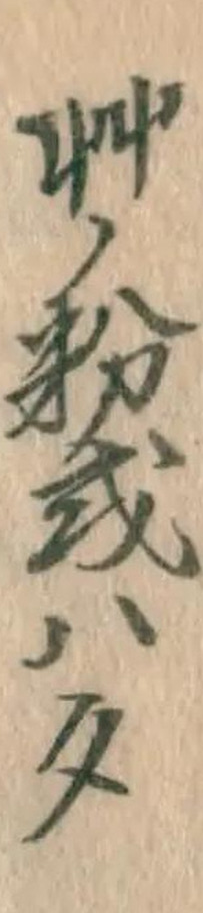艸ノ粉或ハタ
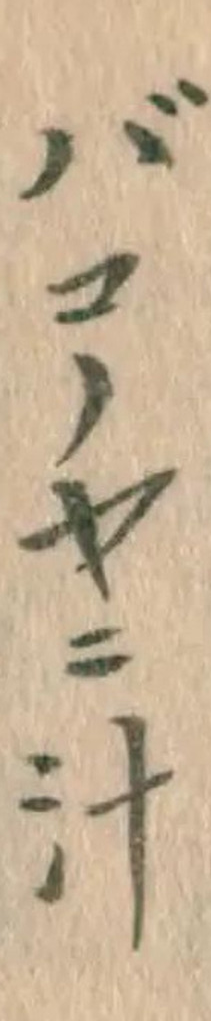バコノヤニ汁
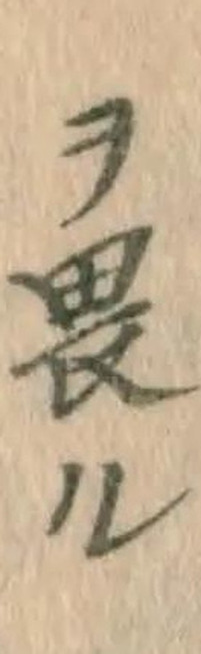ヲ畏ル
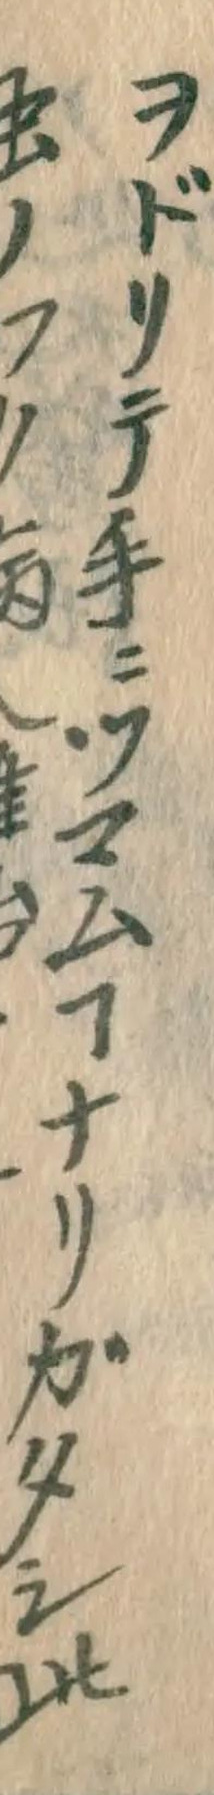ヲドリテ手ニツマムコトナリガタシ此
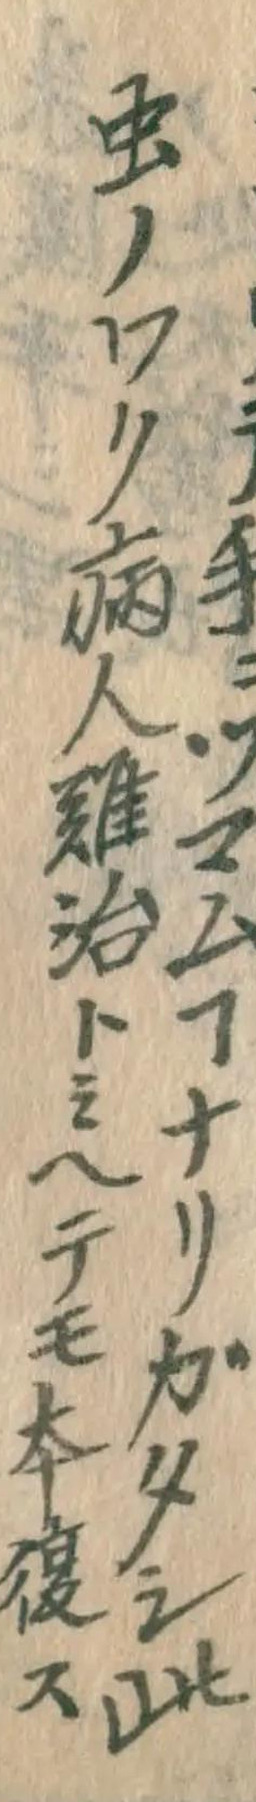虫ノワク病人難治トミヘテモ本復ス

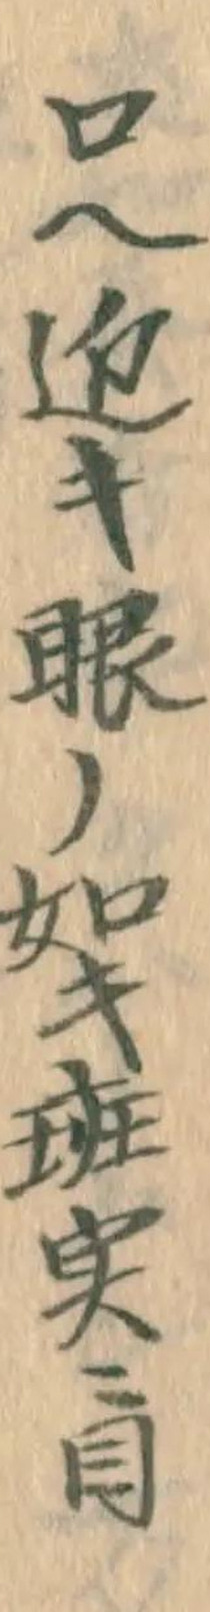口ヘ近キ眼ノ如キ斑実ニ目
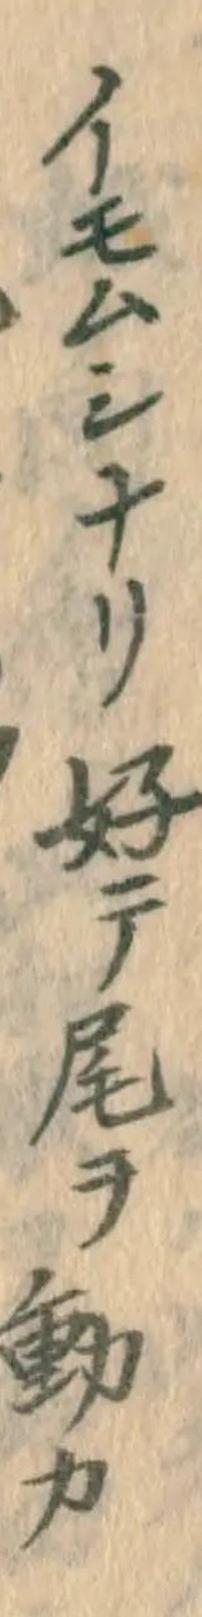イモムシナリ好テ尾ヲ動カ
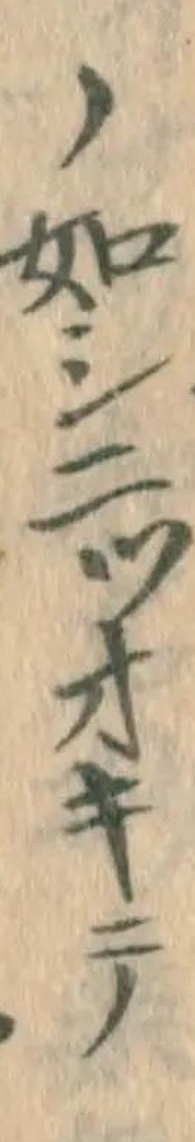ノ如シ二ツオキテ
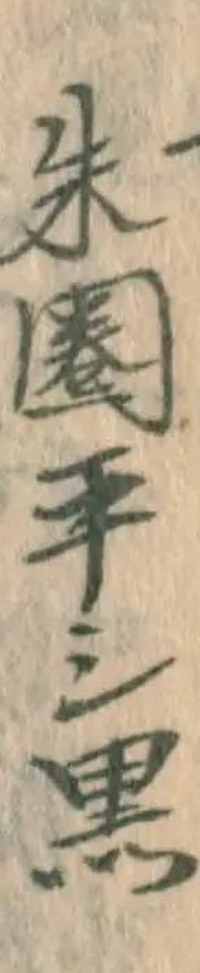朱圏平シ黒
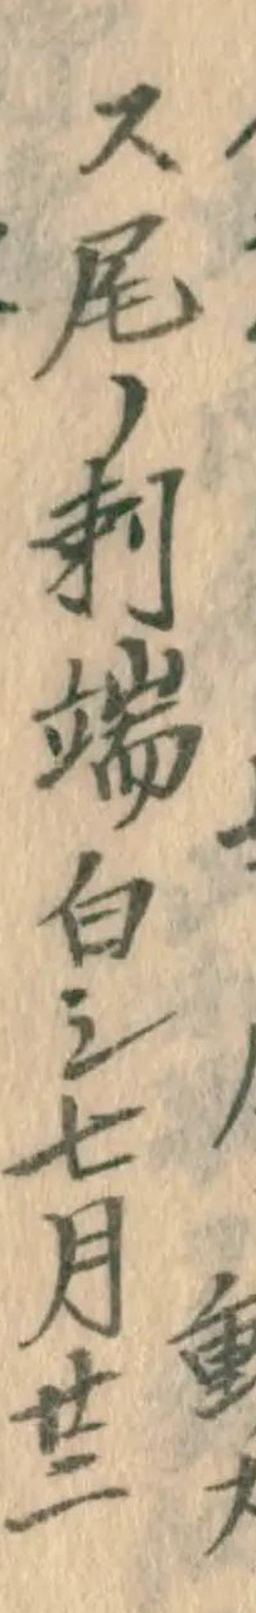ス尾ノ刺端白シ七月廿二
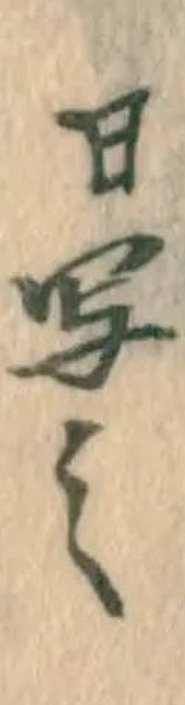日写之
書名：千蟲譜 3巻. [2]
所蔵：国立国会図書館 National Diet Library, JAPAN
